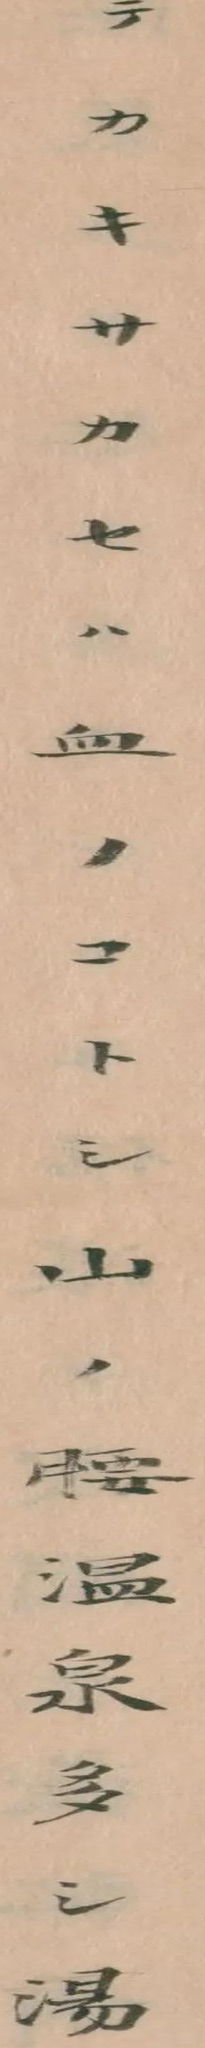テカキサカセハ血ノコトシ山ノ腰温泉多シ湯
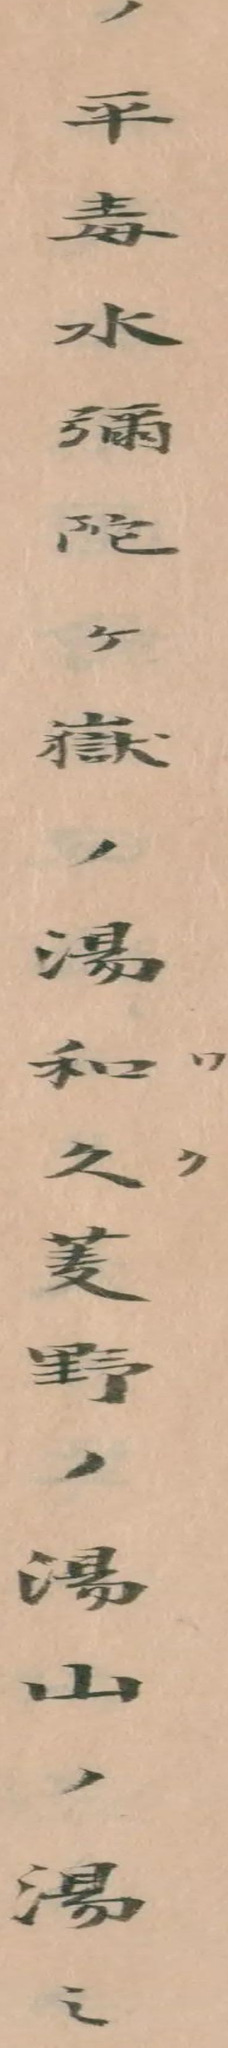ノ平毒水弥陀ヶ嶽ノ湯和久菱野ノ湯山ノ湯ミ
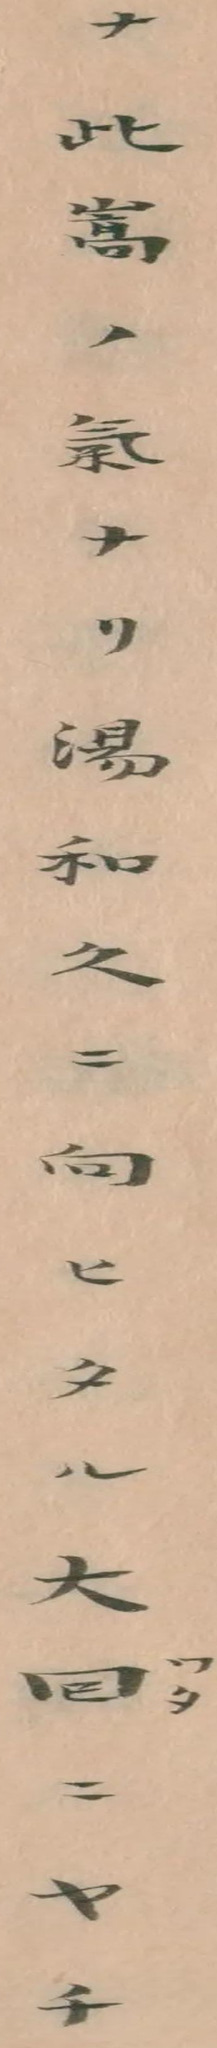ナ此嵩ノ気ナリ湯和久二向ヒタル大囘二ヤチ
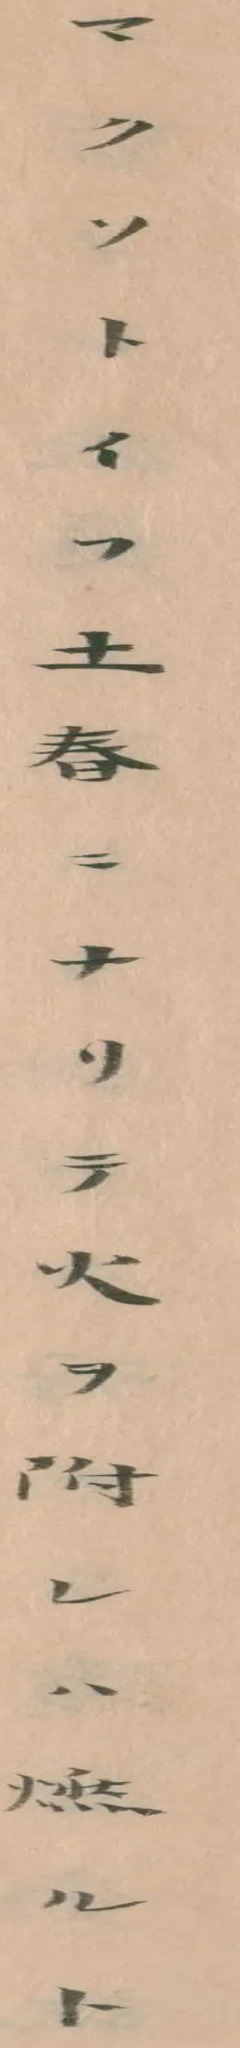マクソトイフ土春二ナリテ火ヲ附ルハ燃ルト

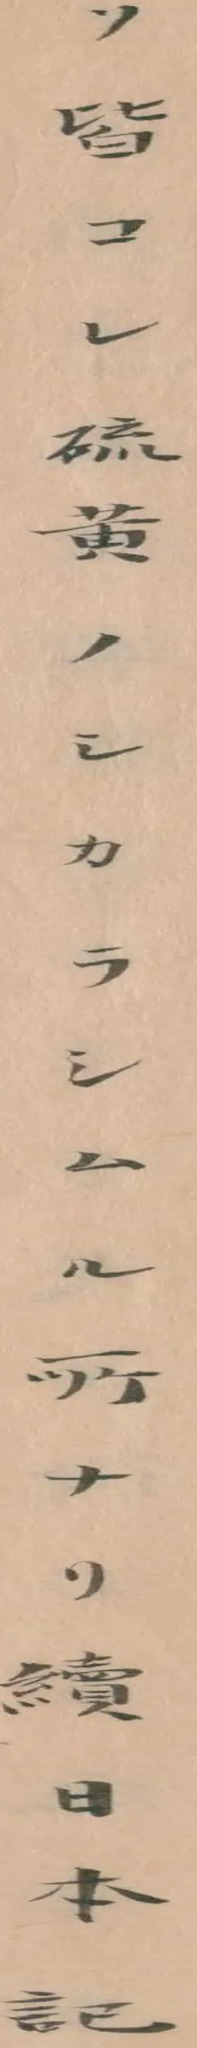ソ皆コレ硫黄ノ̪シカラシムル所ナリ続日本記
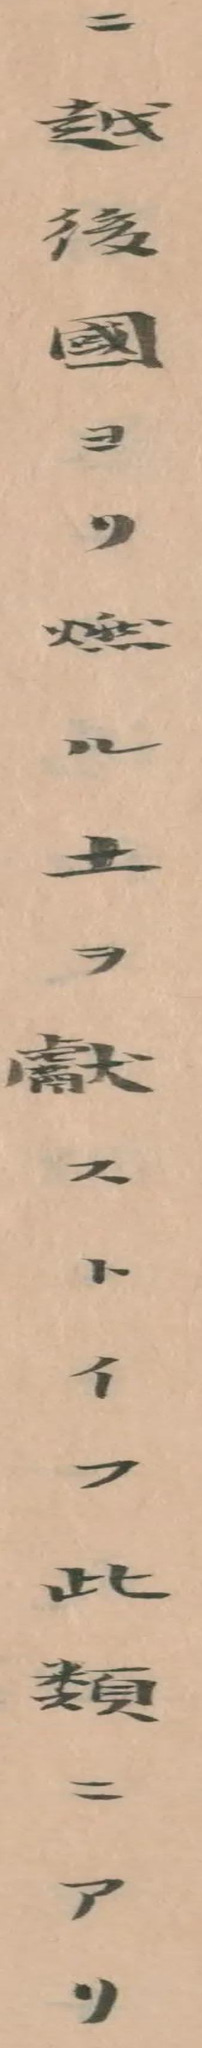二越後国ヨリ燃ル土ヲ献ストイフ此類二アリ
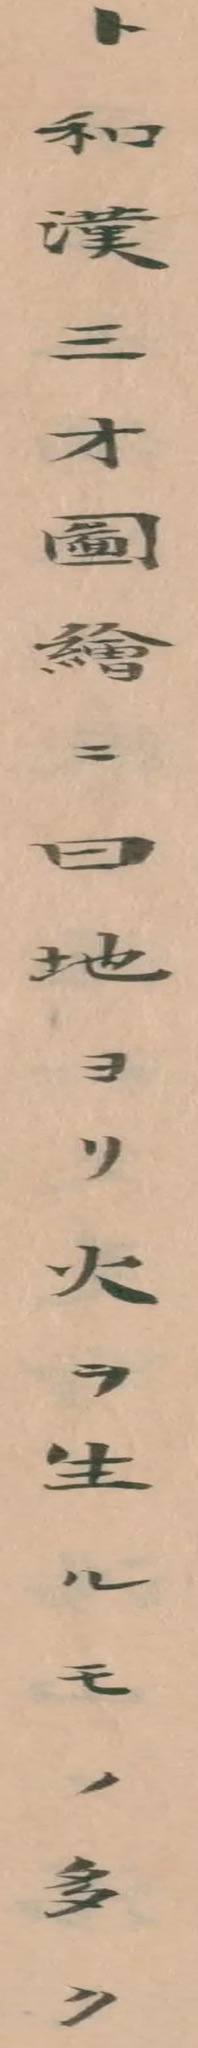ト和漢三才図絵二曰地ヨリ火ヲ生ルモノ多ク
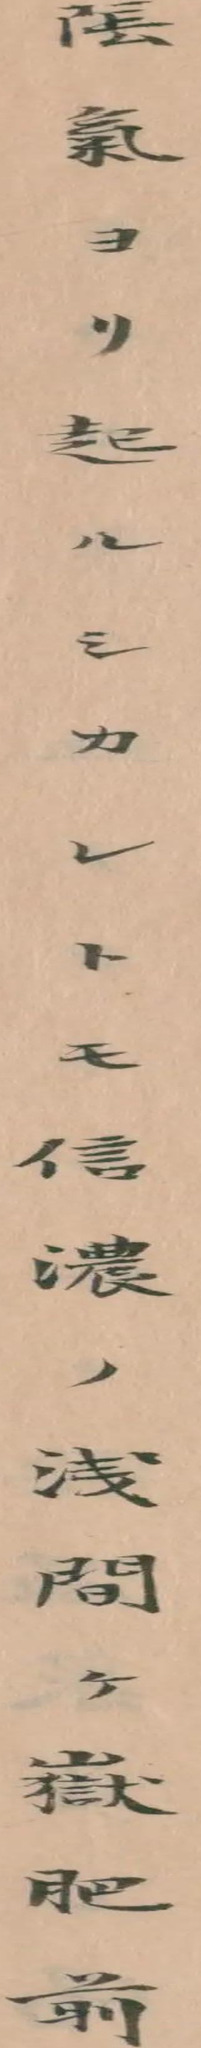陰気ヨリ起ㇽシカレトモ信濃ノ浅間ヶ嶽肥前
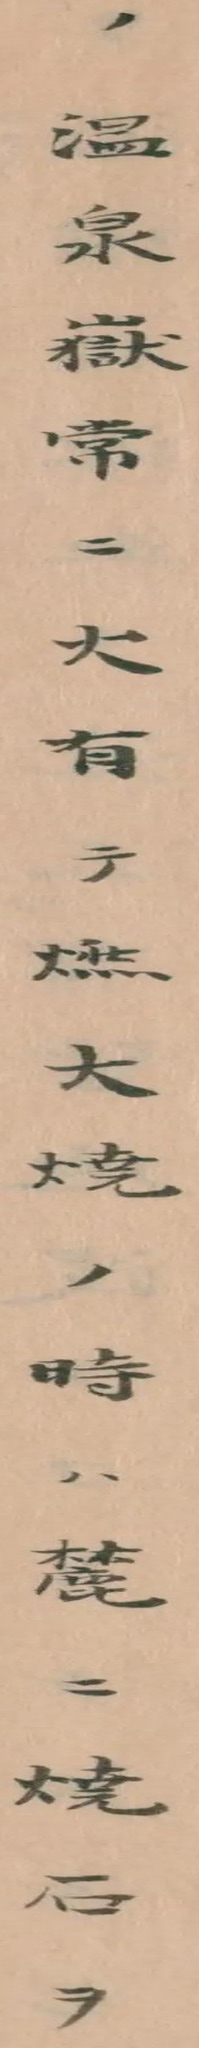ノ温泉嶽常二火有テ燃大焼ノ時ハ麓二焼石ヲ
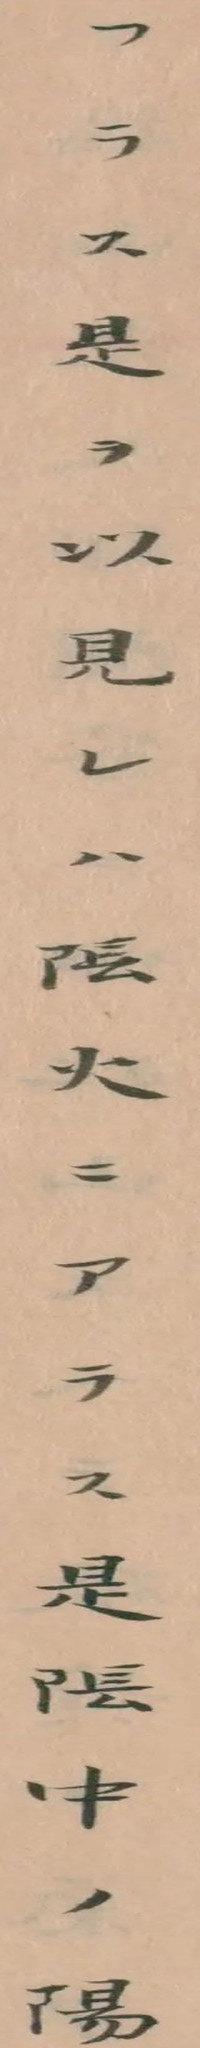フラス是ヲ以見レハ陰火二アラス是陰中ノ陽
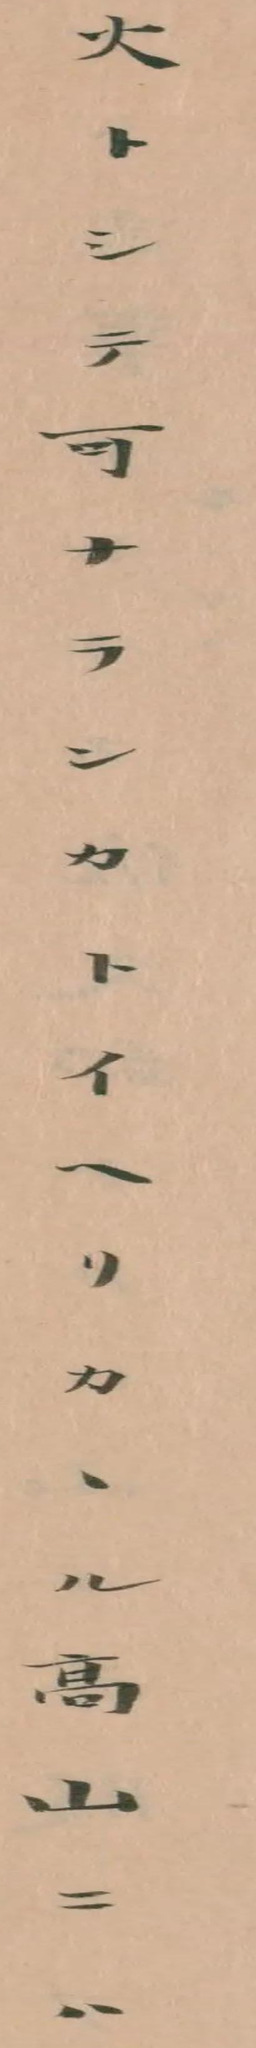火トシテ可ナラシカトイヘリカゝル高山ニハ
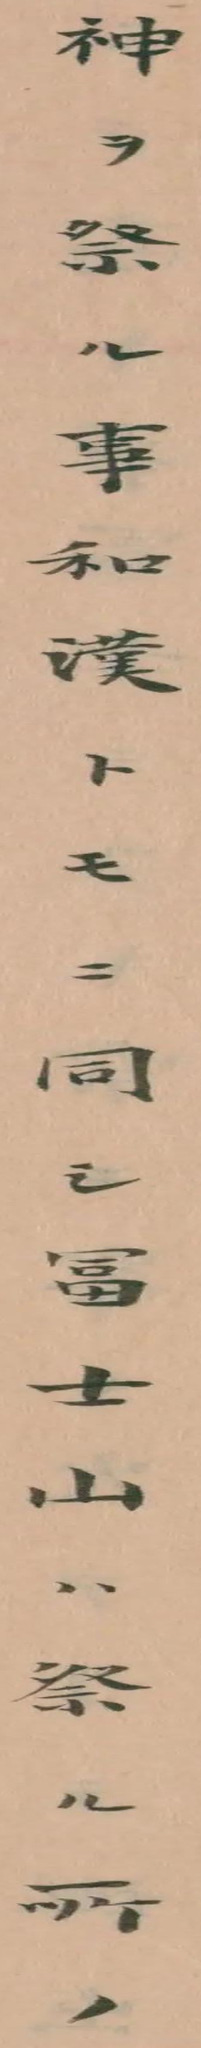神ヲ祭ㇽ事和漢トモ二同シ富士山ハ祭ㇽ所ノ
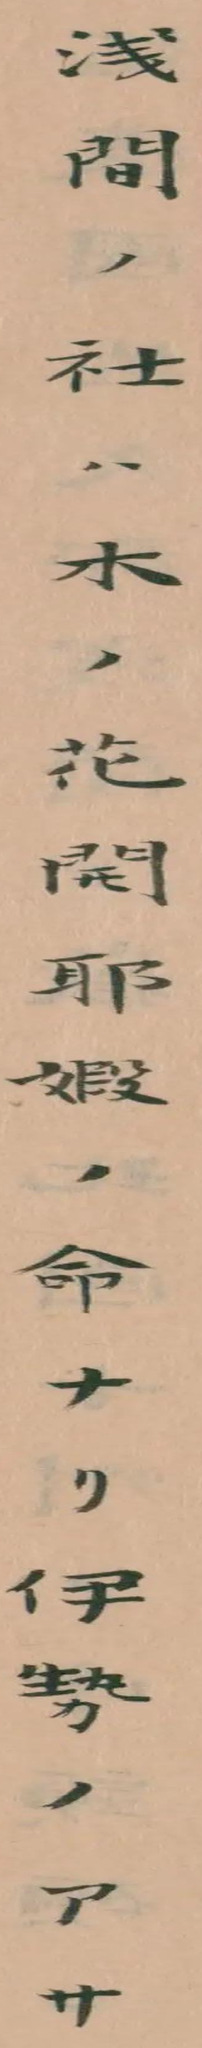浅間ノ社ハ木ノ花開耶媛ノ命ナリ伊勢ノアサ
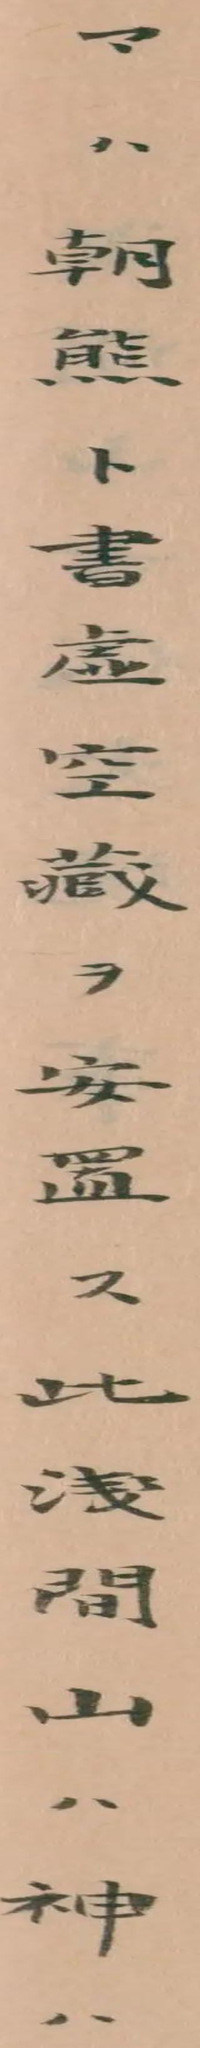マハ朝熊ト書虚空蔵ヲ安置ス此浅間山ハ神ハ
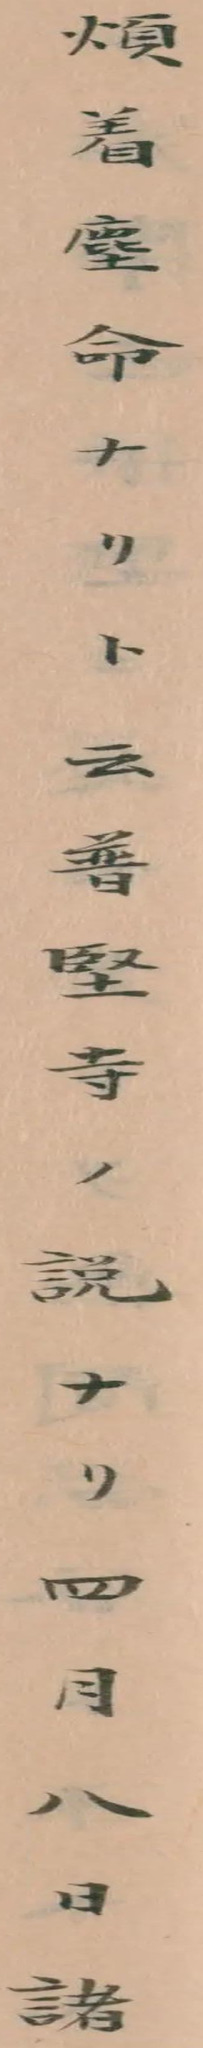煩着塵命ナリト云普堅寺ノ説ナリ四月八日諸
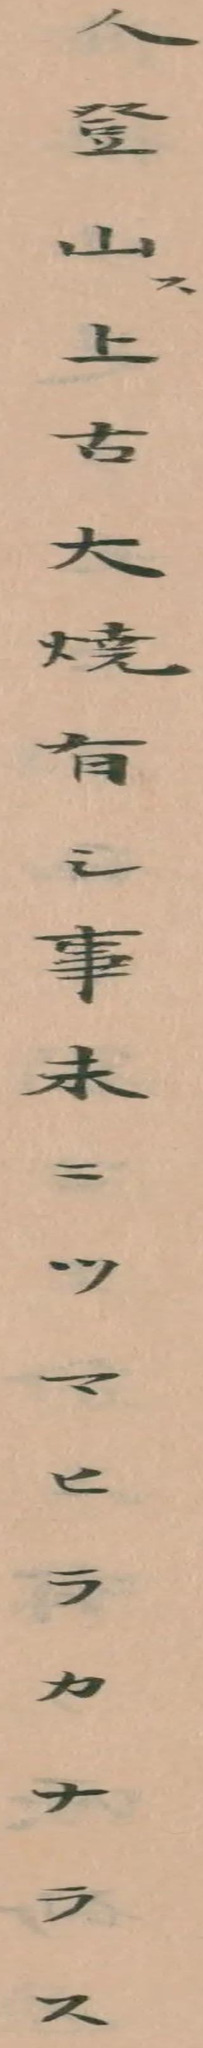人登山ス上方大焼有シ事未二ツマヒラカナラス
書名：地災撮要. 巻3(地震之部)-巻4(噴火之部)
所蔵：国立国会図書館 National Diet Library, JAPAN
